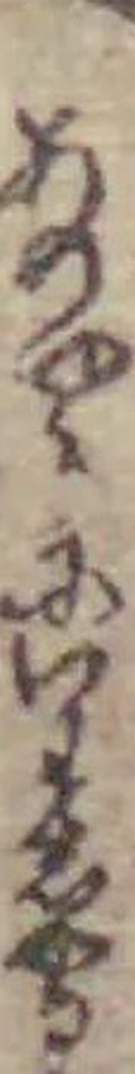あのやうにいわしやる
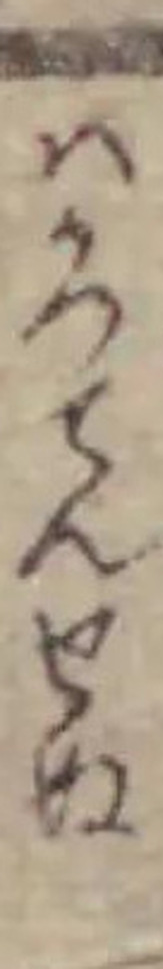はかつてんせぬ
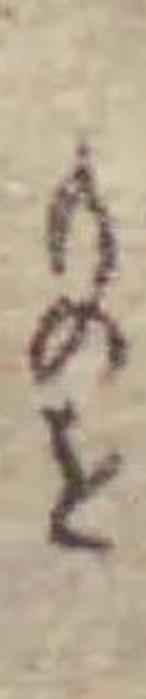ものを
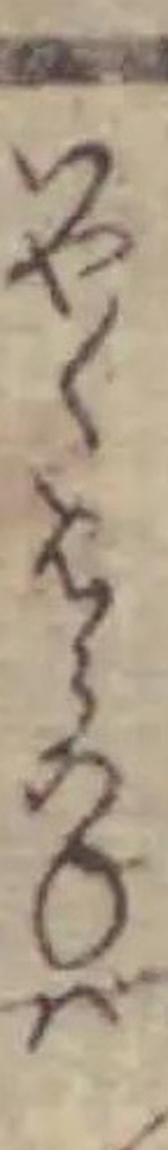いや〳〵はらはねば
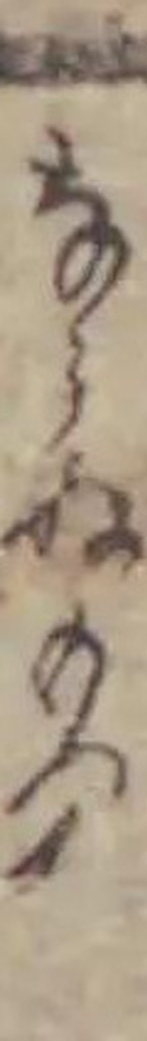ならぬもつて
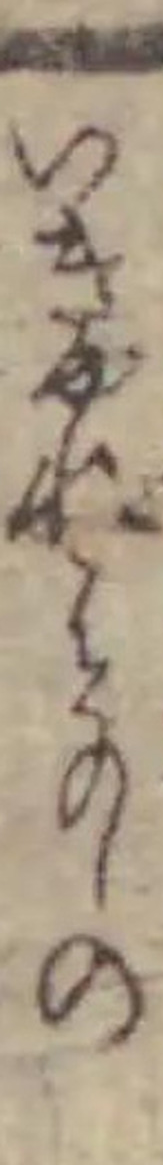いきやれこともしの
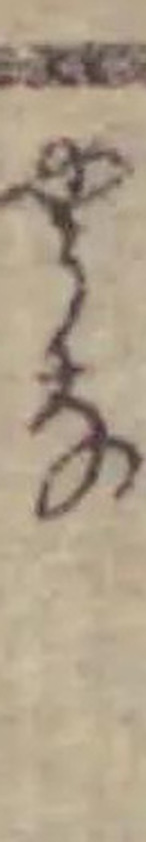やうな
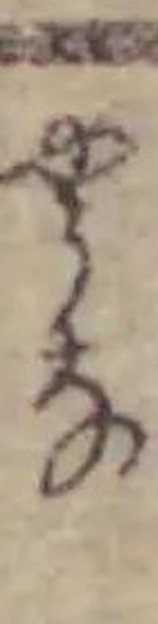やうな
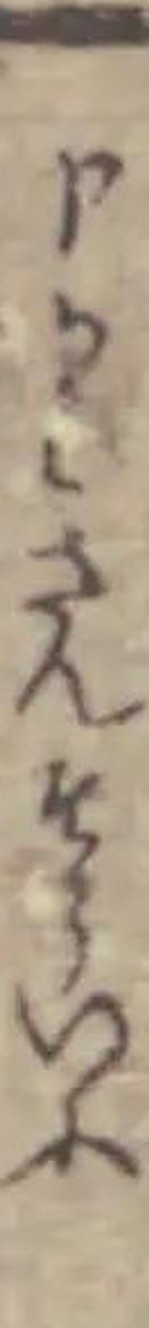申かみさんそういふ
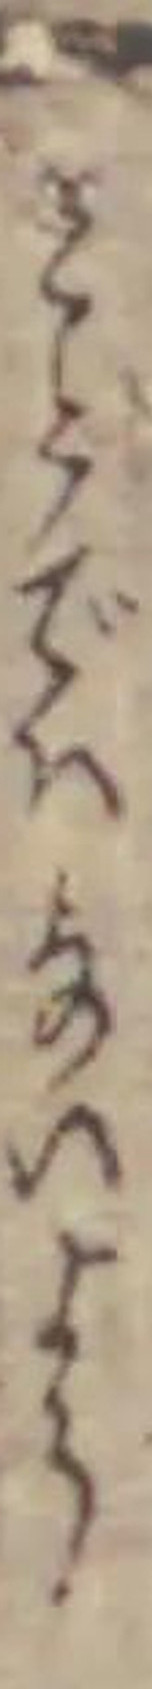ことではないよう
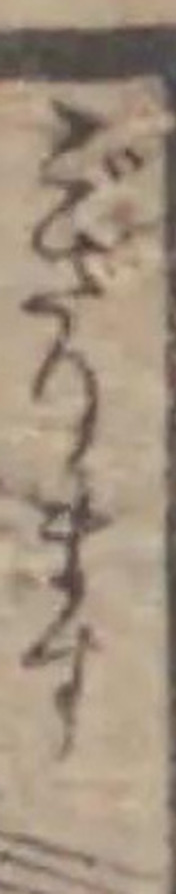ござります
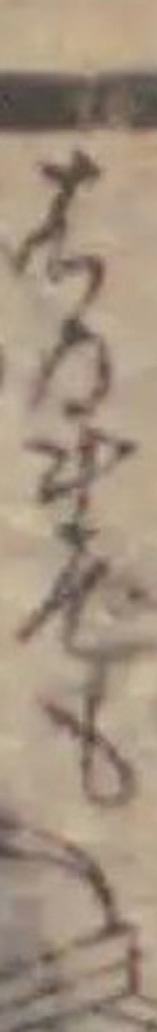はるまでも
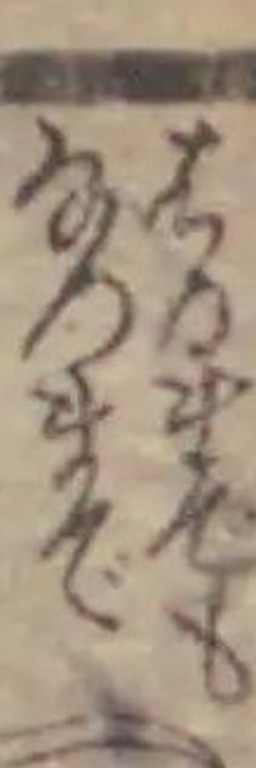なつまで
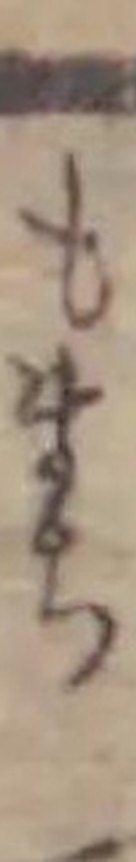もまち
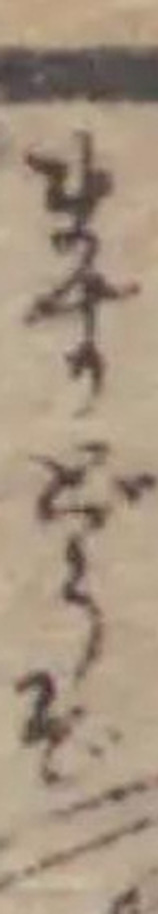ますどうぞ
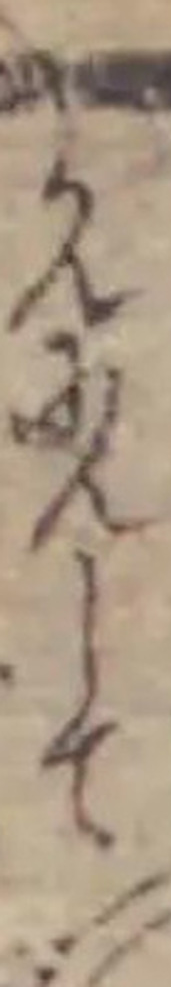かんにんして
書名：飛た間違矢口噂 2巻
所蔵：国立国会図書館 National Diet Library, JAPAN
